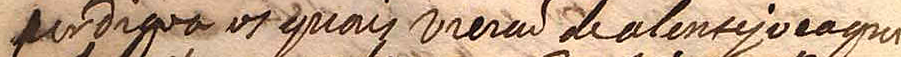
perdigoa os quais vieraõ de alentejo e aqui
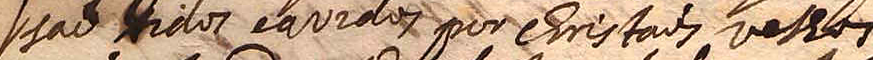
saõ tidos e avidos por christaõs velhos
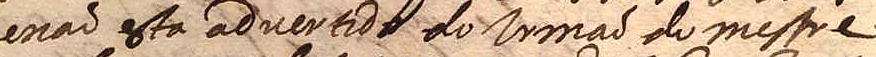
e naõ esta aduertido do Irmaõ do mestre
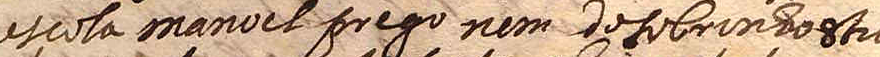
escola manoel prego nem do sobrinho estu
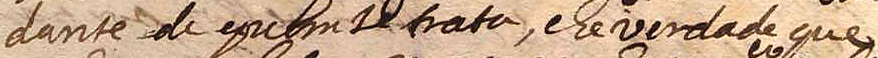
dante de quem se trata, e he verdade que
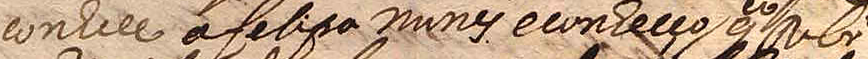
conhece a felipa nunes e conheceo gço Ribro
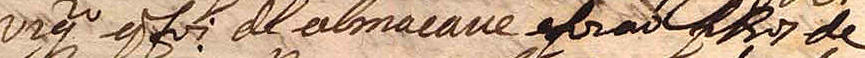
vigro q̄ foi de almacaue e foraõ filhos de
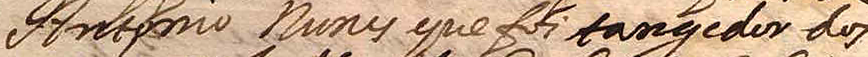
Antonio Nunes que foi tangedor dos
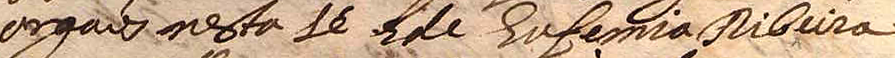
orgaõs nesta Sé E de Eufemia Ribeira
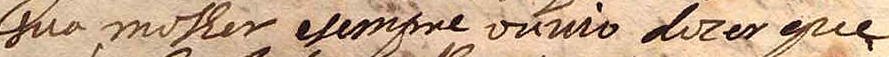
sua molher e sempre ouuio dizer que
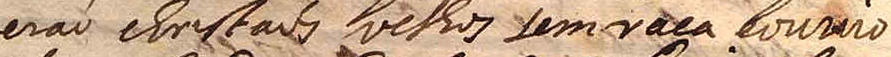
eraõ christaõ velhos sem raça e ouuio
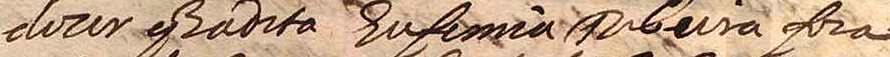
dizer q̄ a dita Eufemia Ribeira fora
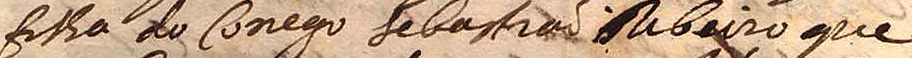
filha do Conego sebastiaõ Ribeiro que
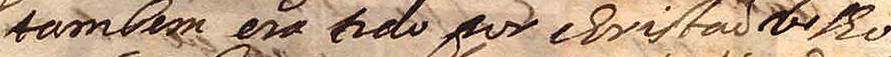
tambem era tido por christaõ velho
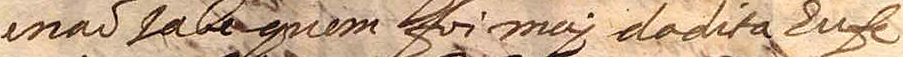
e naõ sabe quem foi maj da dita Eufe
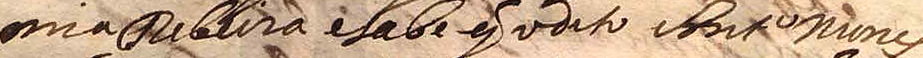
mia Ribeira e sabe q̄ o dito Anto nunes
